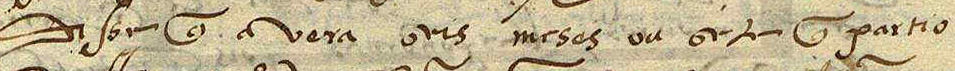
disse q̅ avera seis meses ou sete q̄ partio
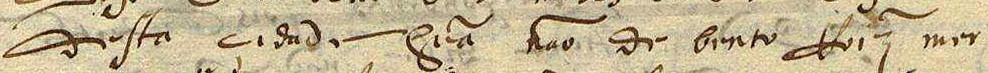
desta çidade hu̅a n̄ao de bento Roiz̄ mer
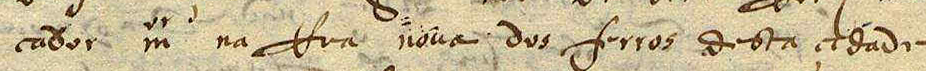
cador mor na Rua noua dos ferros desta cidade
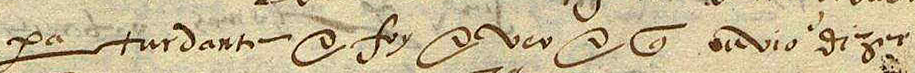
ꝑa turdante e foy e veo e q̅ ouvio dizer
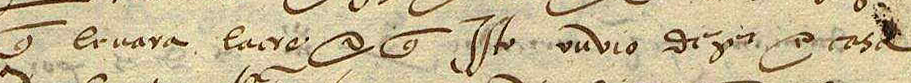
q̄ leuara lacre e q̅ Jsto ouvio dizer ē casa
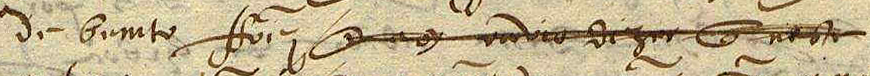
de bemto Roīz _
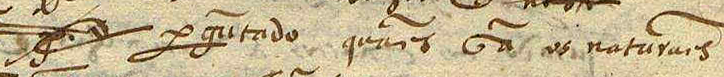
_ e ꝑgūtado quāes sa̅ os natur̄aes
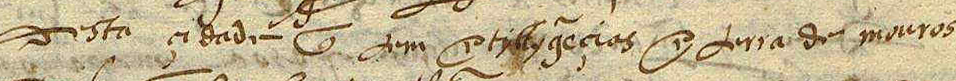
desta cidade q̅ tem e ētyllygēcias ē terra de mouros
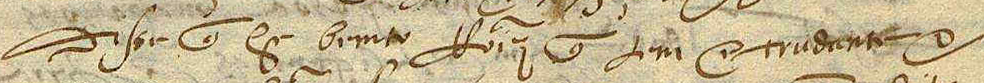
disse q̄ he bemto Roiz q̄ tem ē trudante e
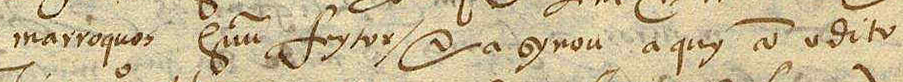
marroquos hu̅u feytor / e asynou aquy cō o dito
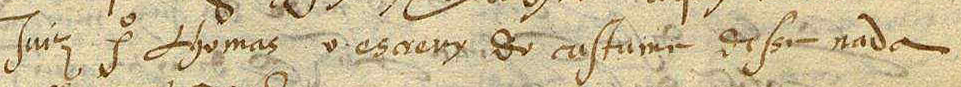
Juiz po thomas o escreuy do custume disse nada
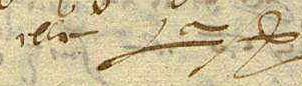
elle ta
